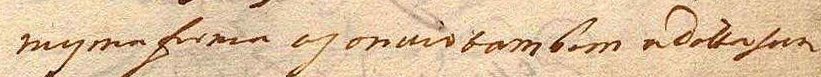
mesma forma as ouuio tambem a ditta sua
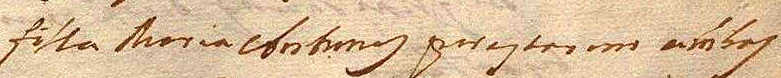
filha Maria Antunes por estarem ambas
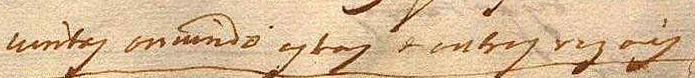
iuntas ouuindo estas e outras rezois
